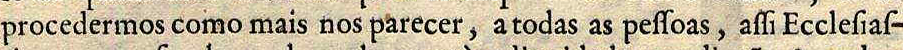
procedermos como mais nos parecer, a todas as pessoas, assi Ecclesias
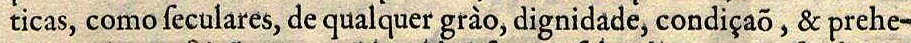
ticas, como seculares, de qualquer grào, dignidade, condiçaõ, & prehe
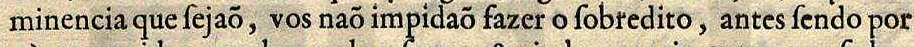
minencia que sejaõ, vos naõ impidaõ fazer o sobredito, antes sendo por
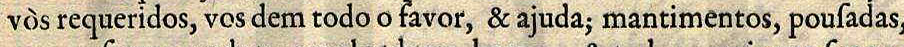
vòs requeridos, vos dem todo o favor, & ajuda, mantimentos, pousadas,
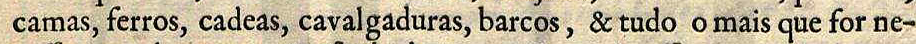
camas, ferros, cadeas, cavalgaduras, barcos, & tudo o mais que for ne
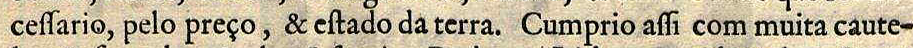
cessario, pelo preço, & estado da terra. Cumprio assi com muita caute
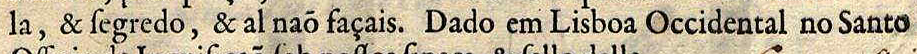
la, & segredo, & al naõ façais. Dado em Lisboa Occidental no Santo
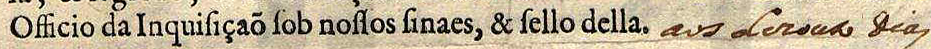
Officio da Inquisiçaõ sob nossos sinaes, & sello della. aos dezouto dias
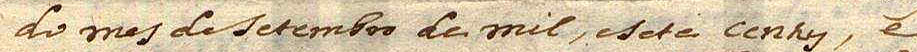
do mes de setembro de mil, e setecentos, e
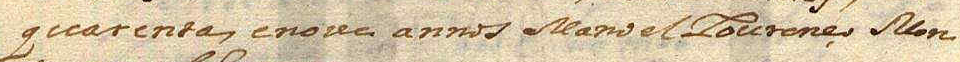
quarenta, e nove annos Manoel Lourenço Mon
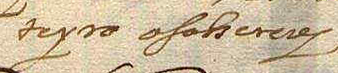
teyro o sobscrevj
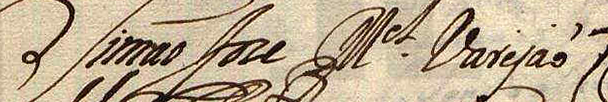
Simaõ Joze M.el Varejaõ
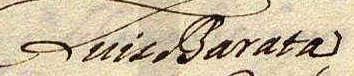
Luiz Barata
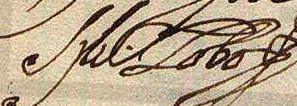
Sylu Lobo
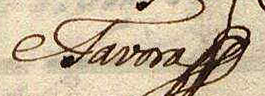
e Tavora
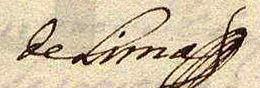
de Lima
